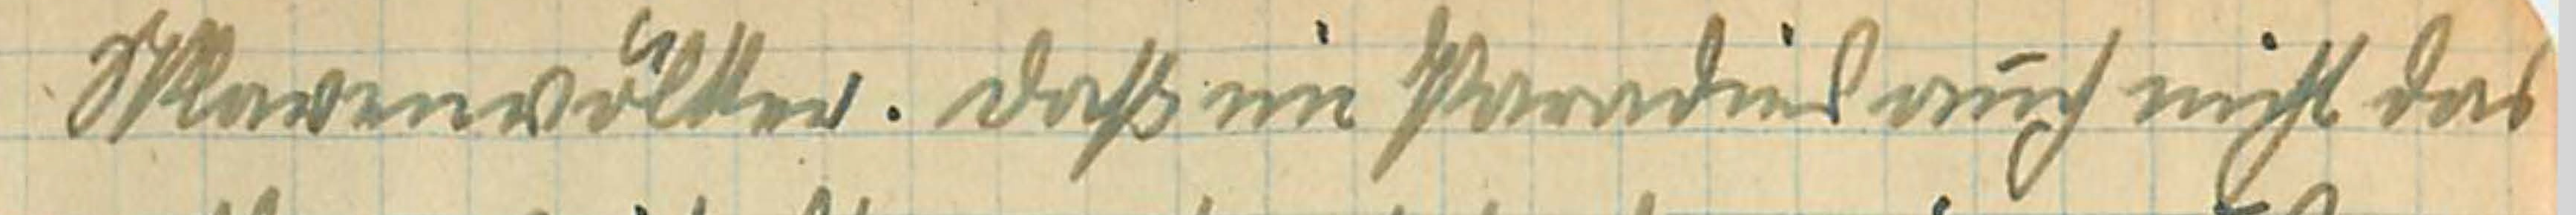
Sklavenvölker. Daß im Paradies auch nicht das
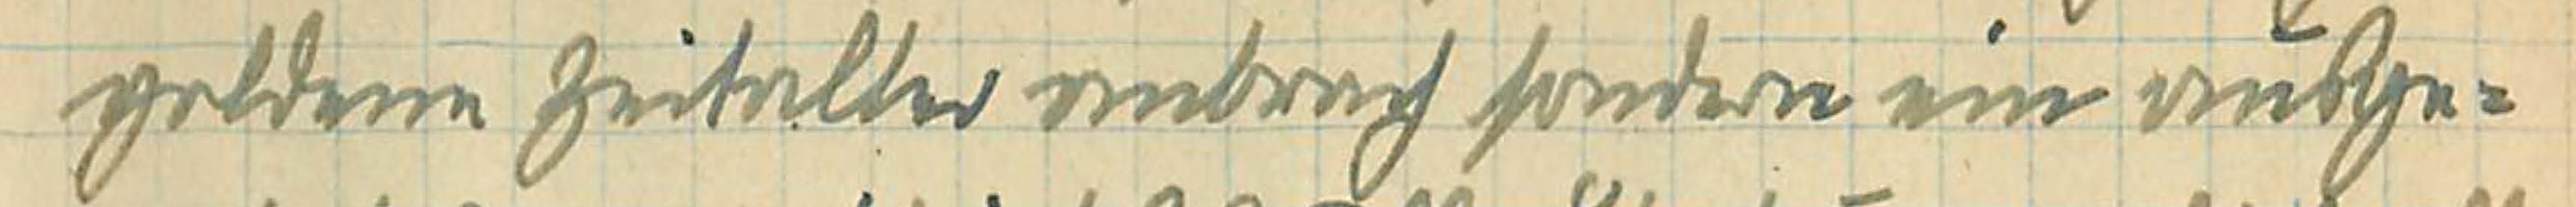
goldene Zeitalter anbrach sondern ein ausge-
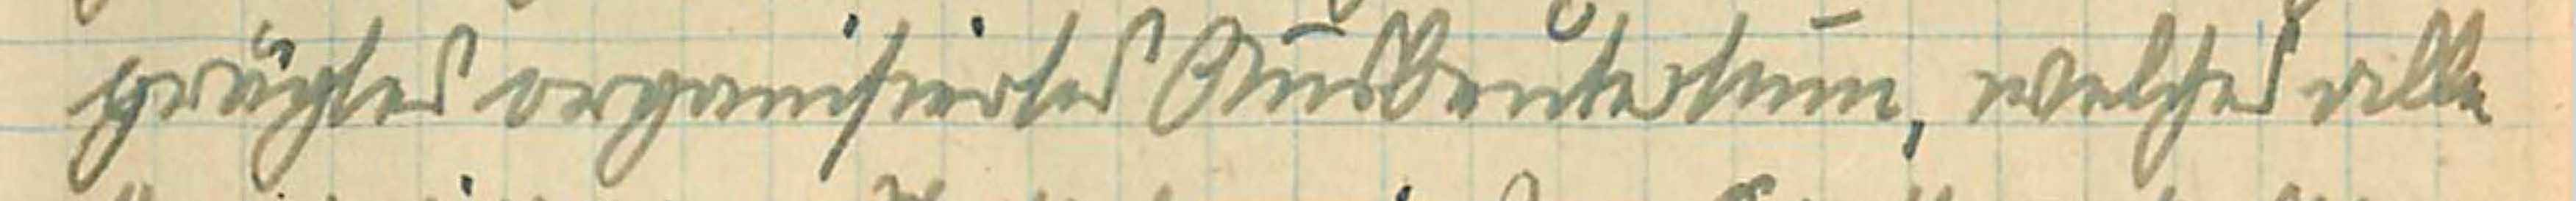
prägtes organisiertes Ausbeutertum, welches alle
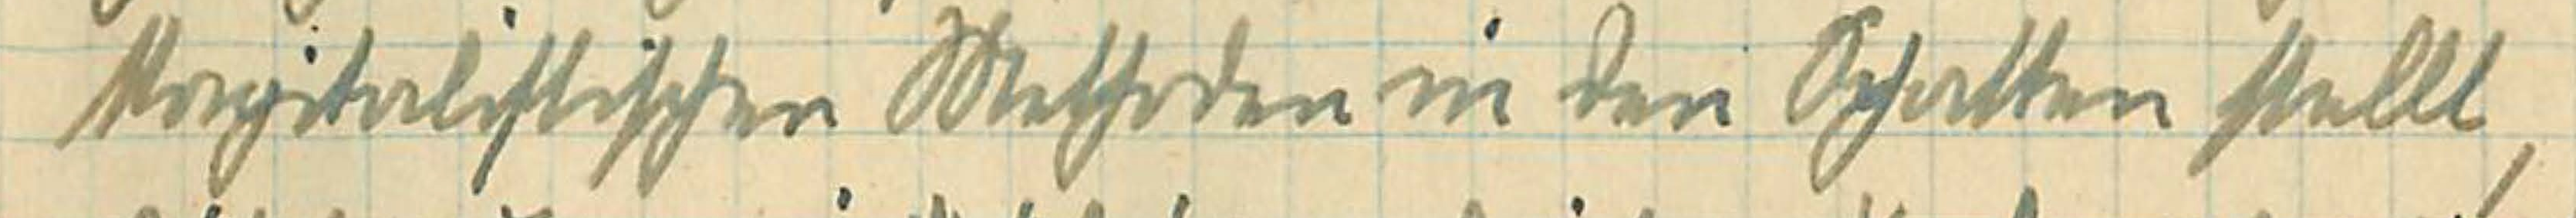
kapitalistischen Methoden in den Schatten stellt,
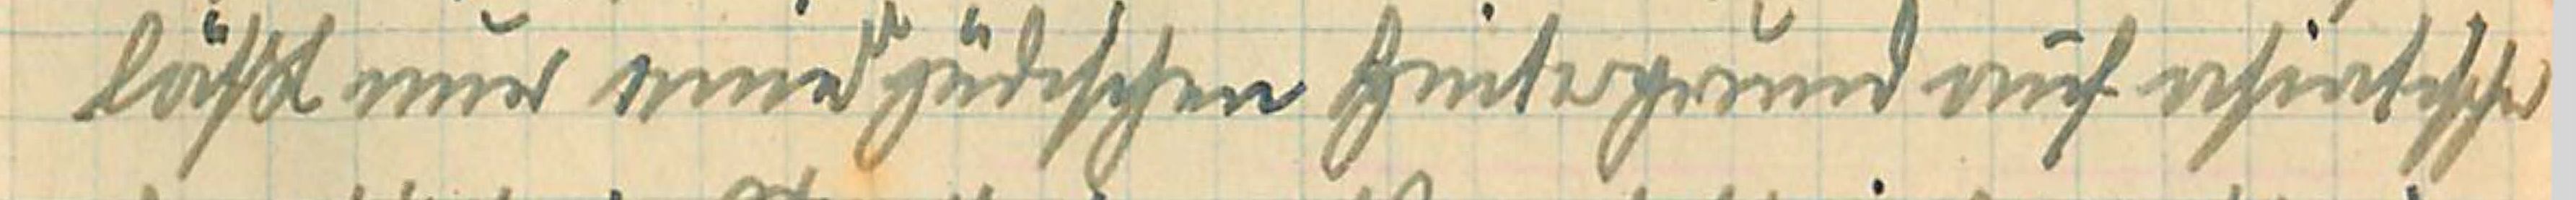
läßt nur einen jüdischen Hintergrund auf asiatischer
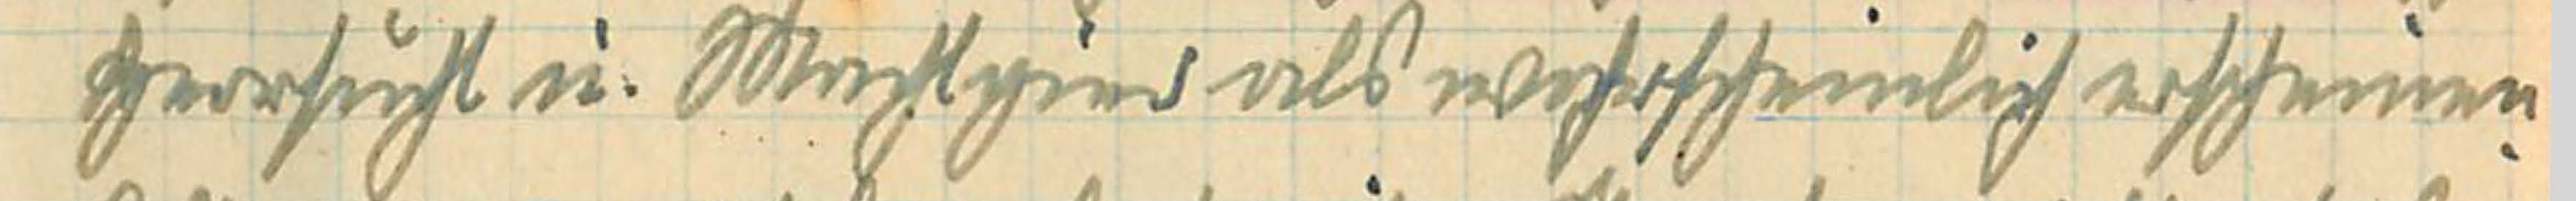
Herrsucht u. Machtgier als wahrscheinlich erscheinen.
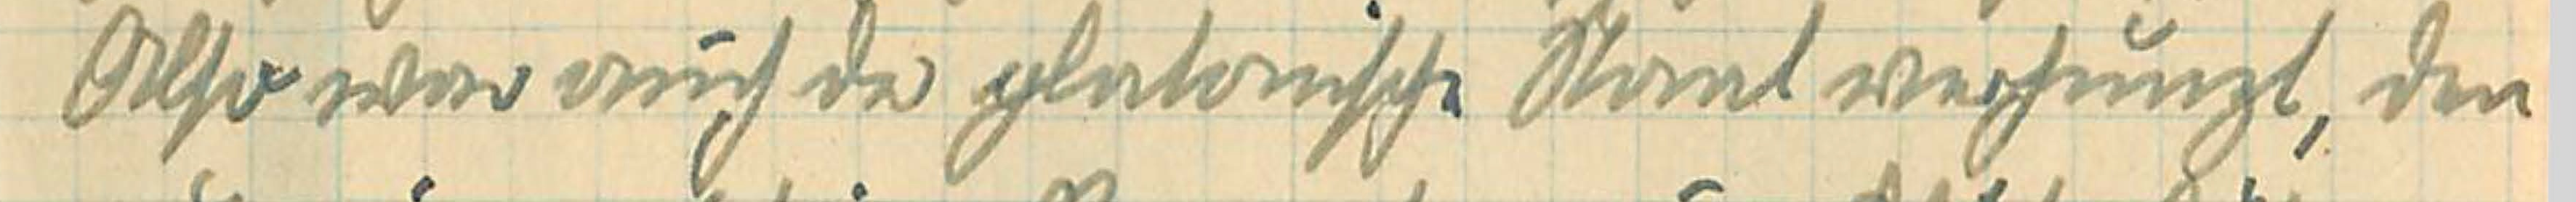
Also war auch der platonische Staat verhunzt, den
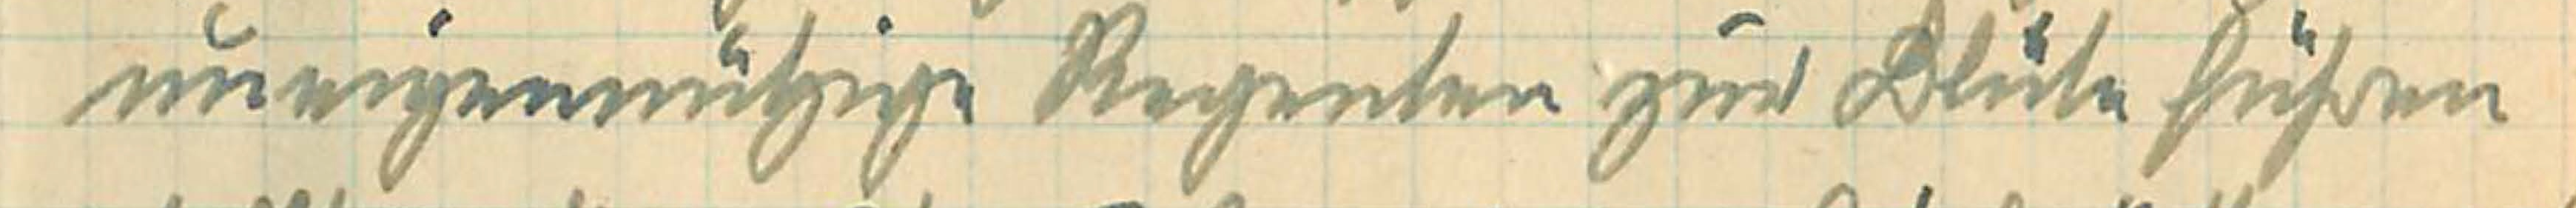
uneigennützige Regenten zur Blüte führen
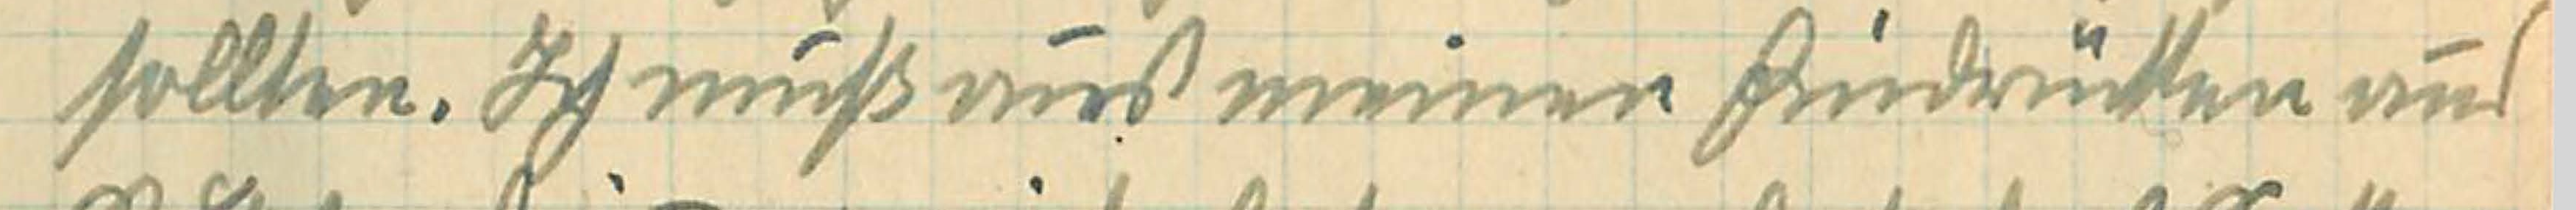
sollten. Ich muß aus meinen Eindrücken aus
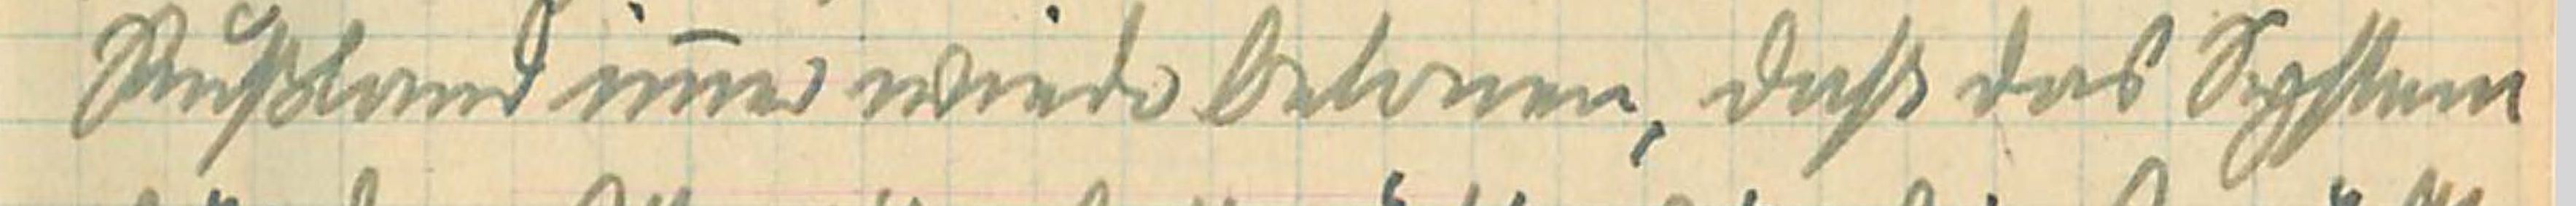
Rußland immer wieder betonen, daß das System
